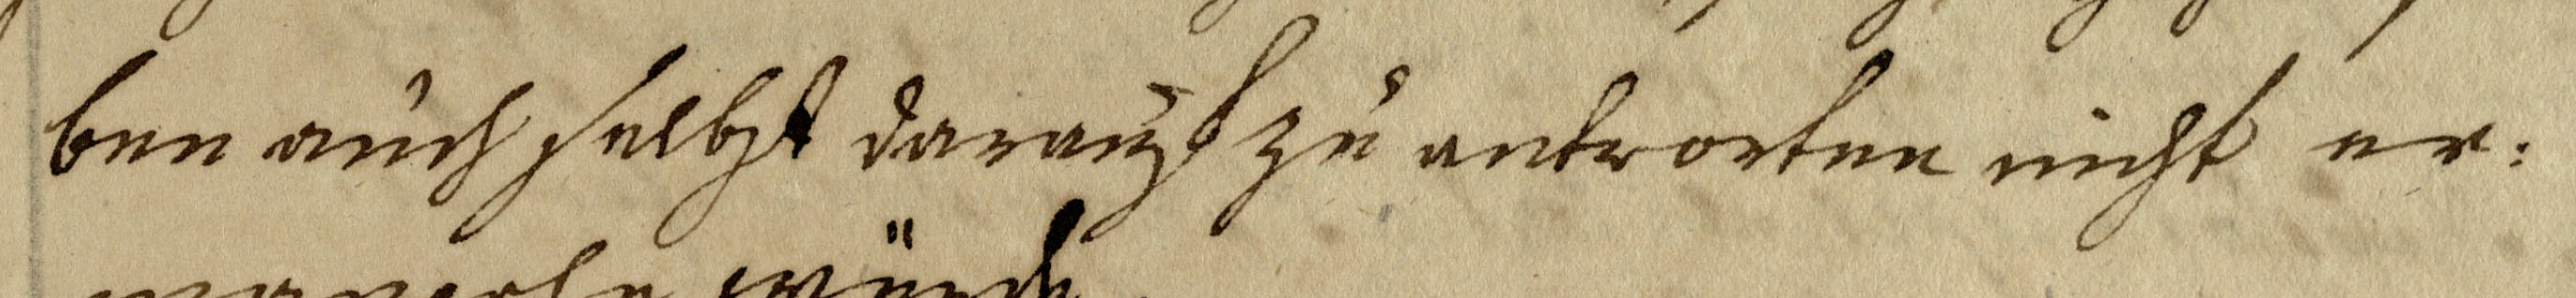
ben auch selbst darauf zu antworten nicht er¬
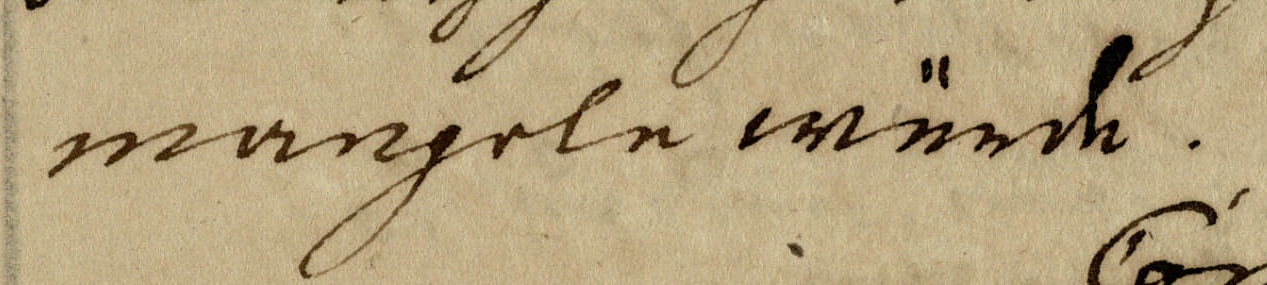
mangeln würde.
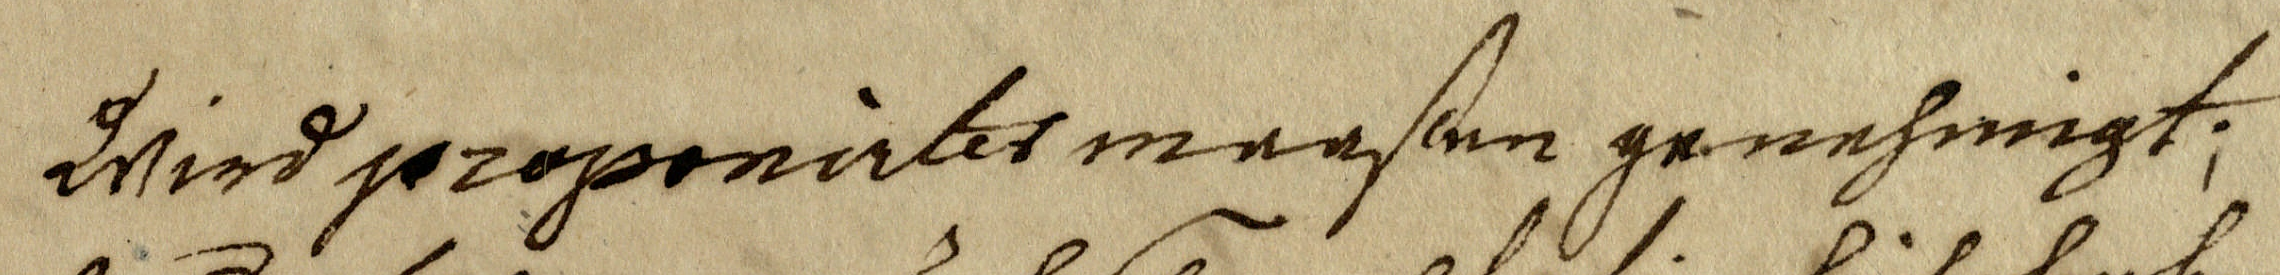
Wird proponirter maaßen genehmigt;
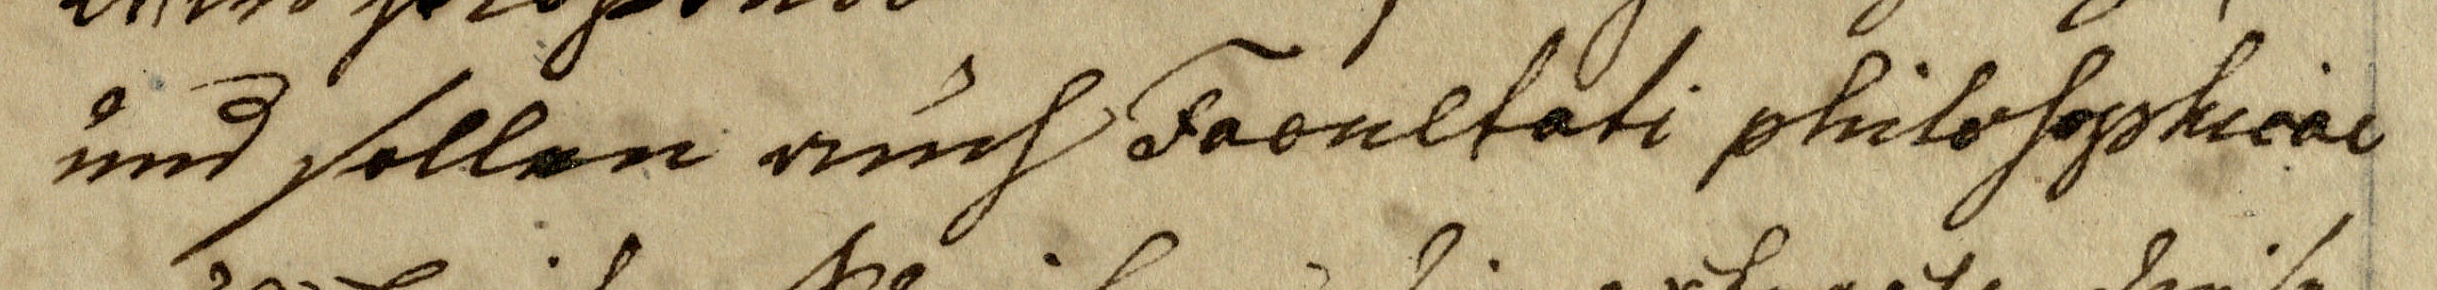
und sollen auch Facultati philosophicae
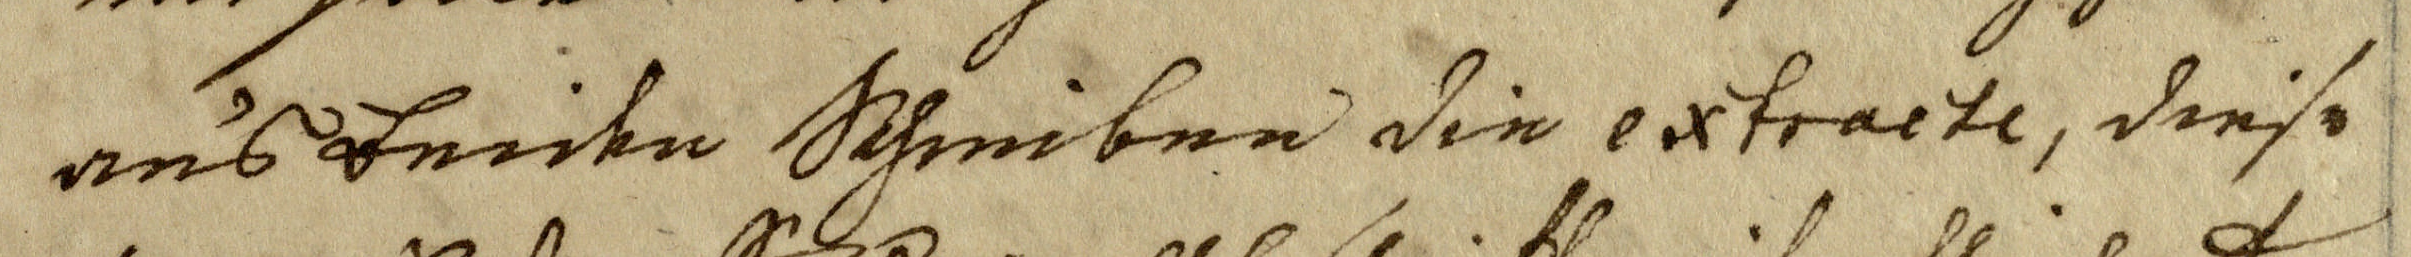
aus beiden Schreiben die extracte, diese
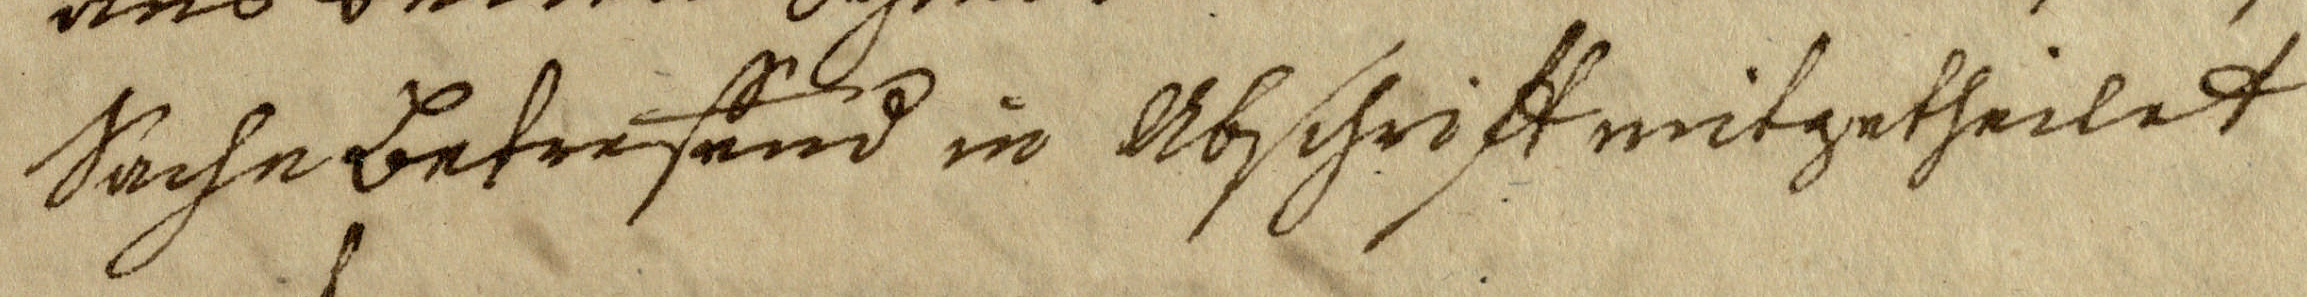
Sache betreffend in Abschrift mitgetheilet
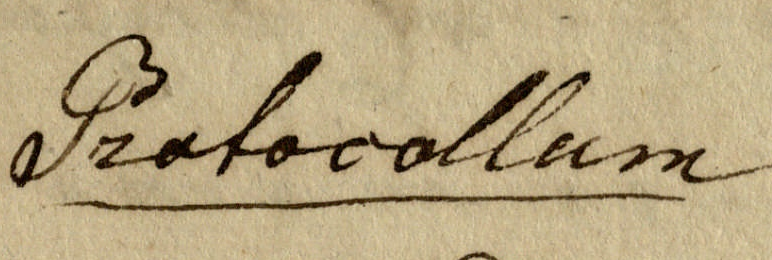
Protocollum
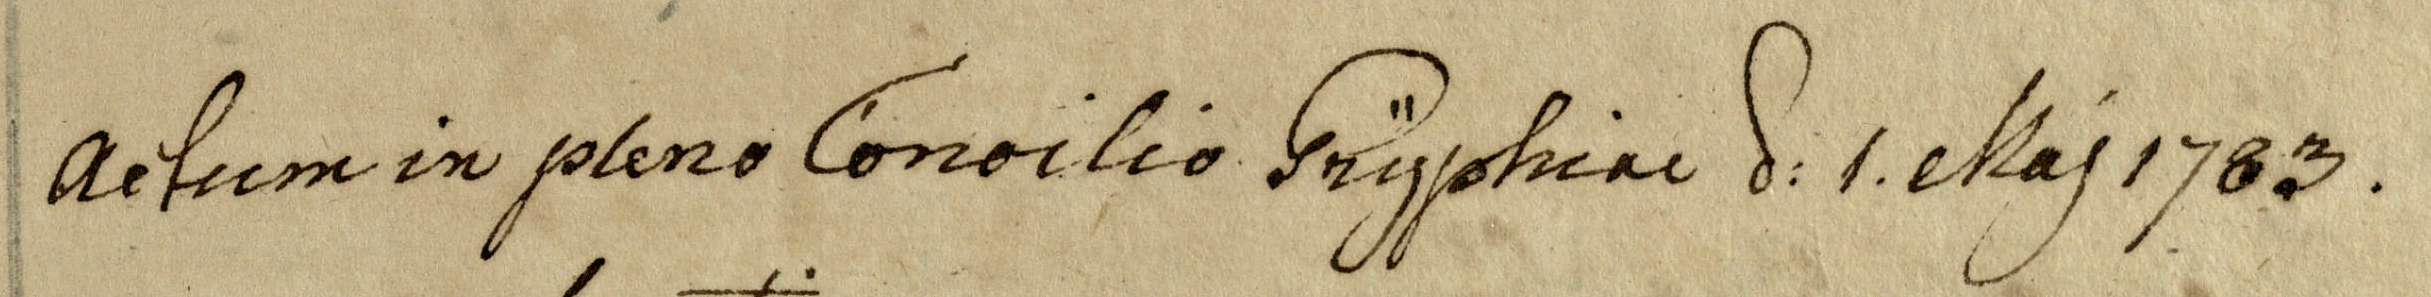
Actum in pleno Concilio Grÿpethiae d. 1. Maj 1783.
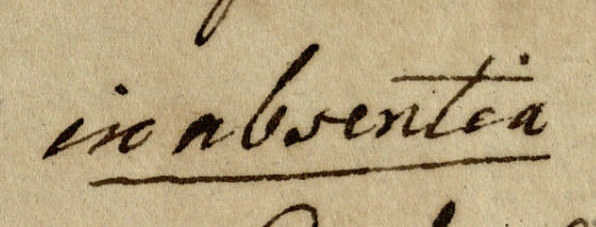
in absentia
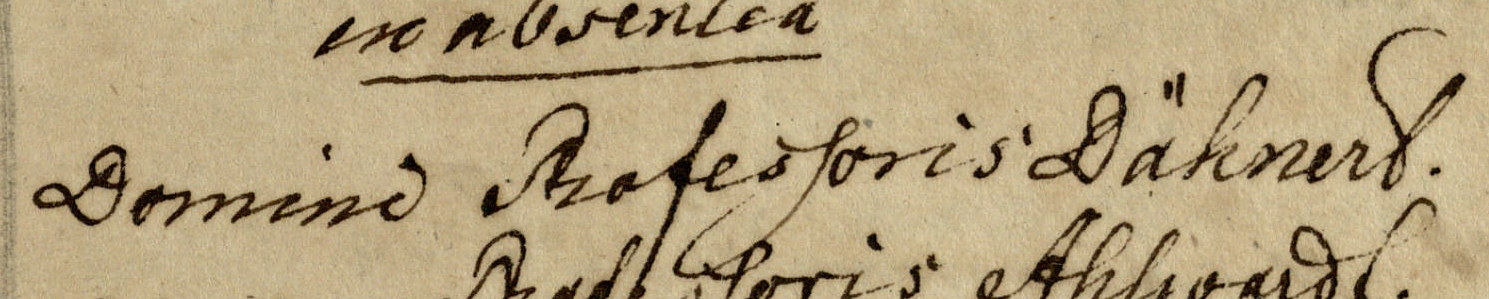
Domini Professoris Dähnert.
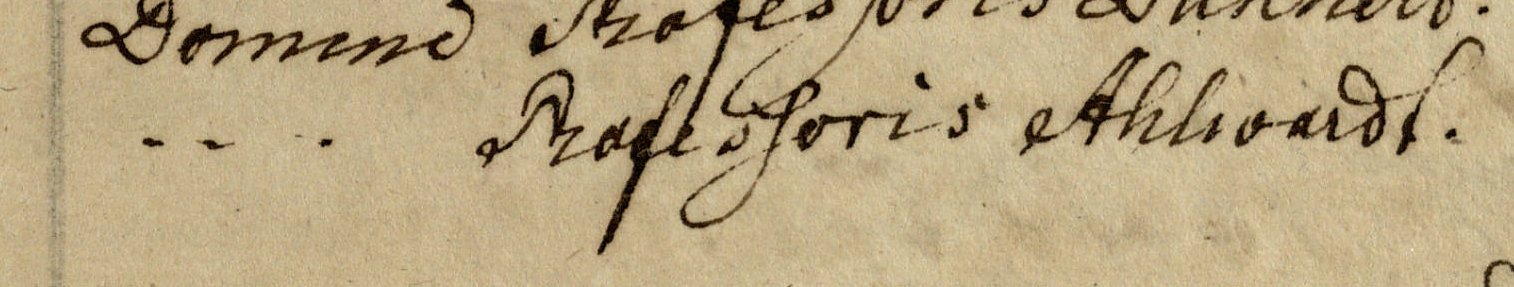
Professoris Ahlwardt.
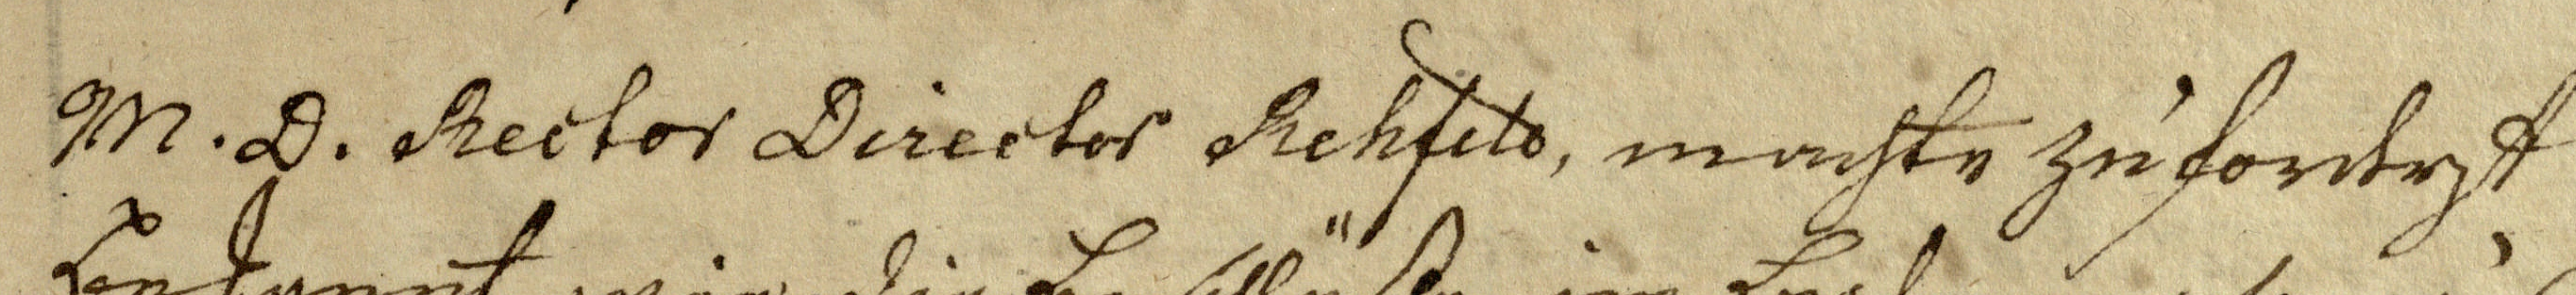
M. D. Rector Director Rehfeld, machte zuforderst
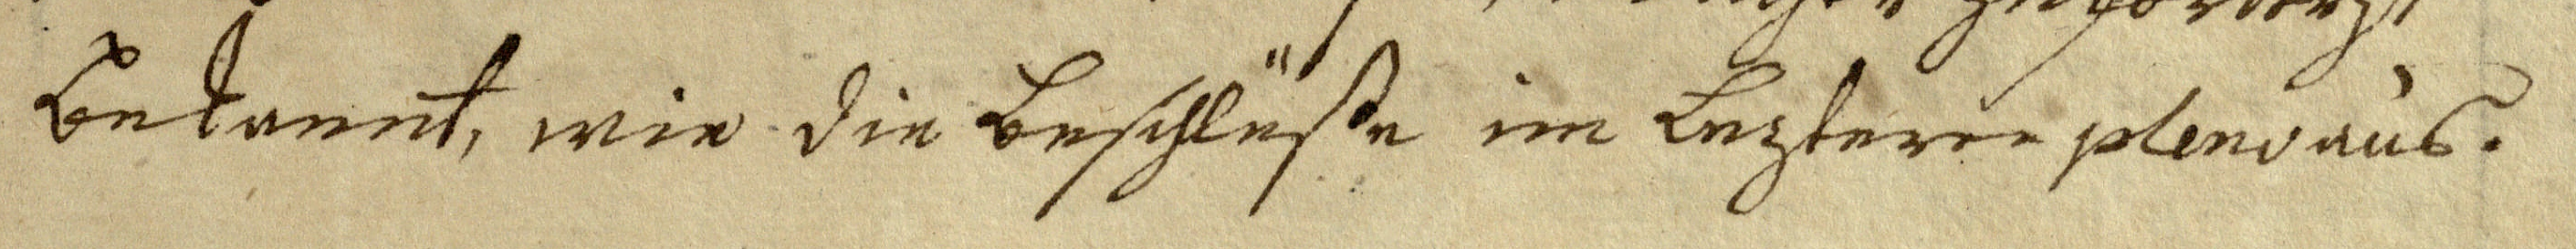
bekannt, wie die Beschlüße im Lezteren pleno aus¬
